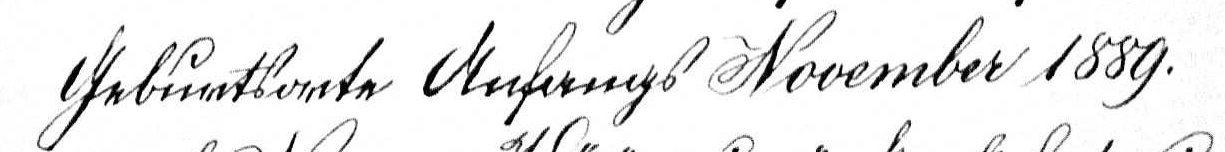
Geburtsorte Anfangs November 1889
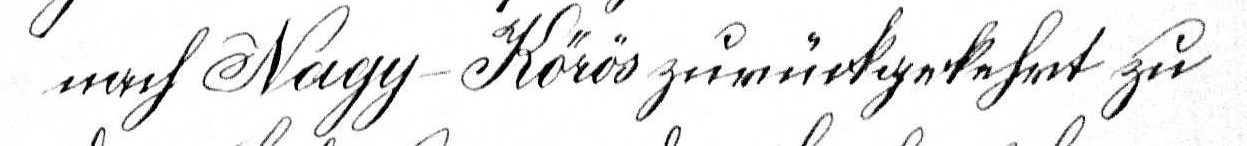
nach Nagy-Kőrös zurückgekehrt zu
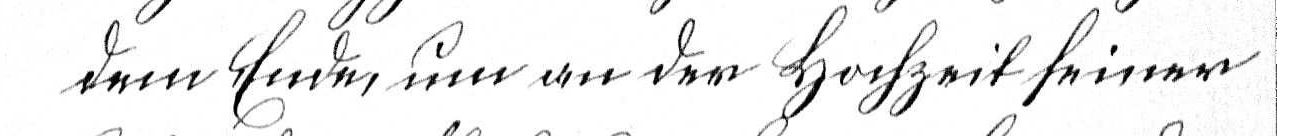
dem Ende um an der Hochzeit seiner
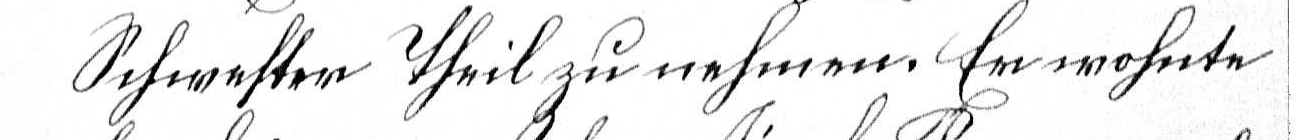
Schwester Theil zu nehmen. Er wohnte
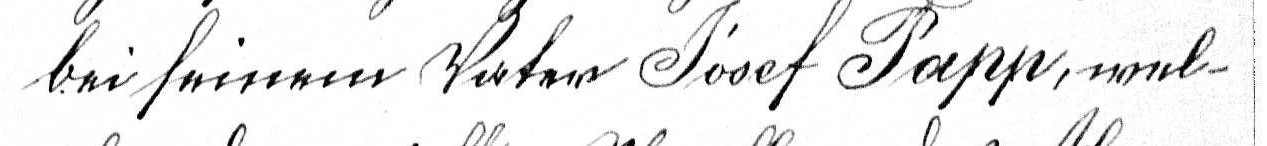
bei seinem Vater Jósef Papp, wel¬
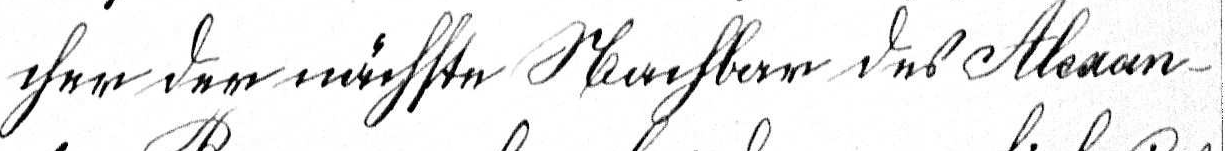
cher der nächste Nachbar des Alexan¬
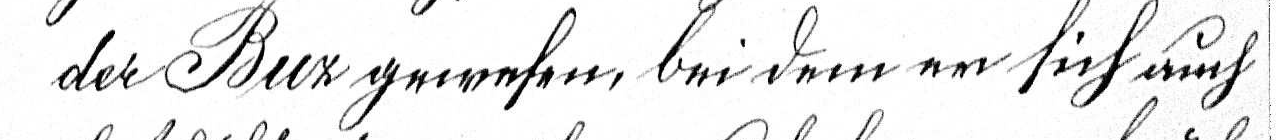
der Buz gewesen, bei dem er sich auch
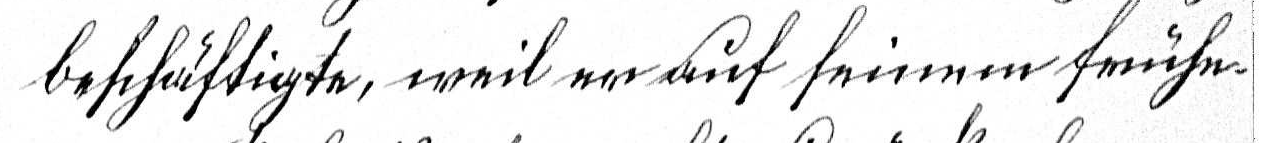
beschäftigte, weil er auf seinen frühe¬
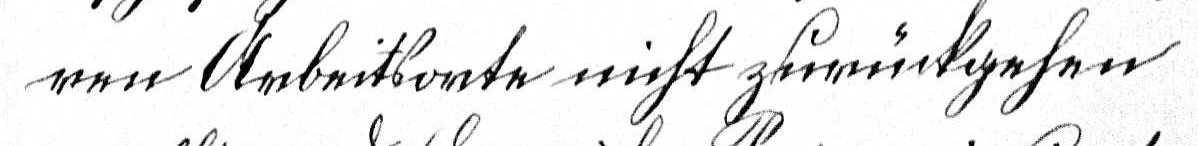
ren Arbeitsorte nicht zurückgehen
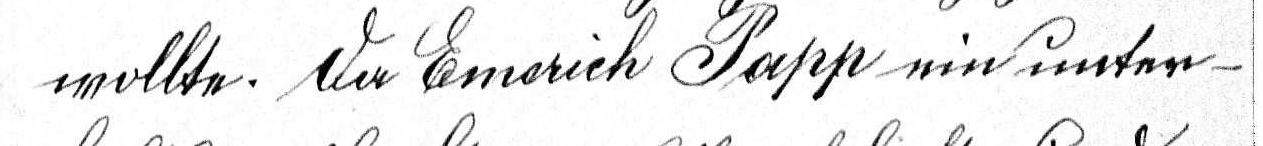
wollte. Da Emerich Papp ein unter¬
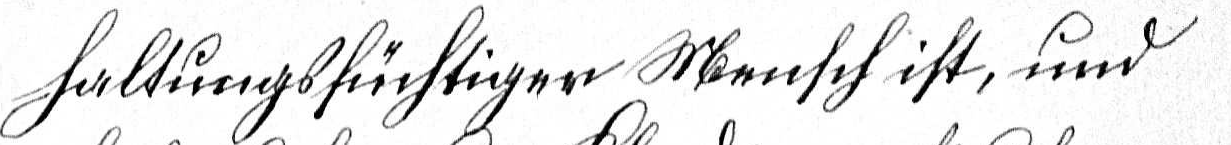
haltungssüchtiger Mensch ist, und
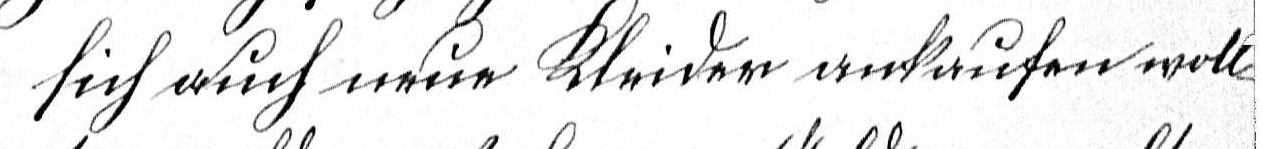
sich auch neue Kleider ankaufen woll¬
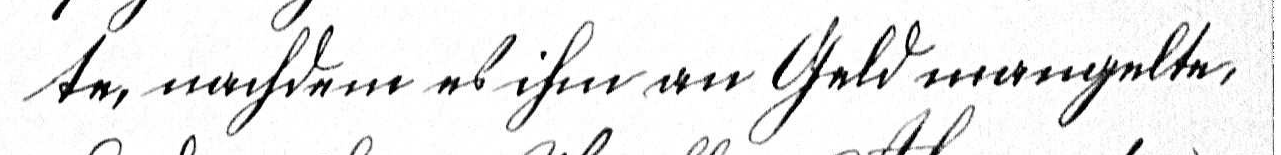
te, nachdem es ihm an Geld mangelte,
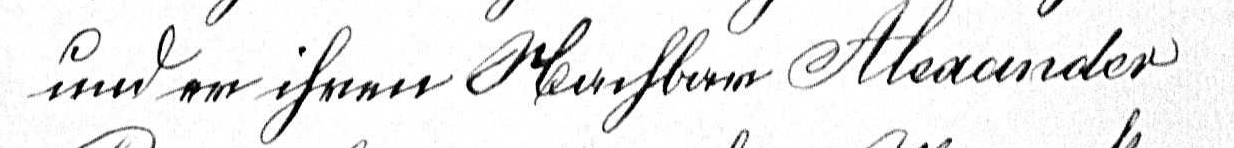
und er ihren Nachbar Alexander
